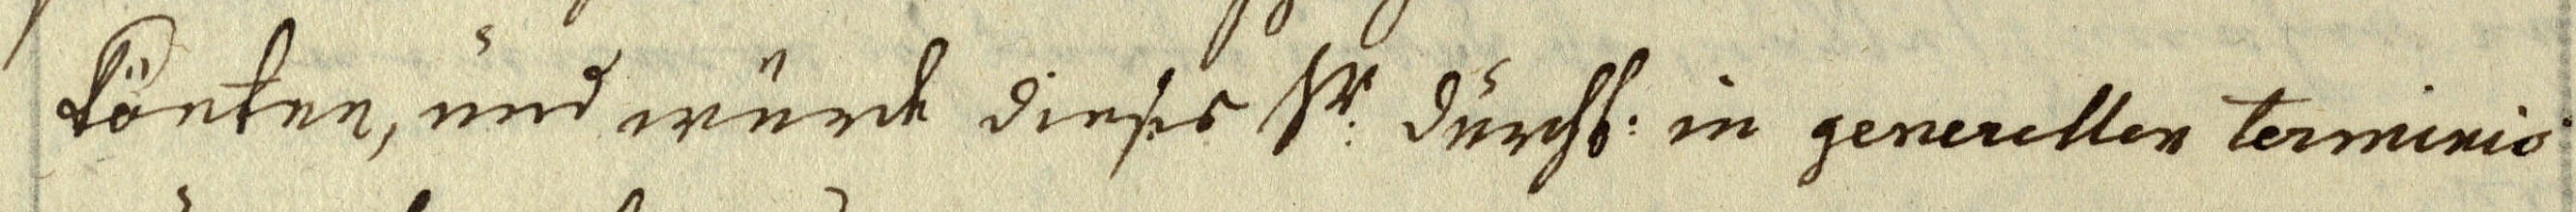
könten, und würde dieses Sr. Durchl. in generellen terminio
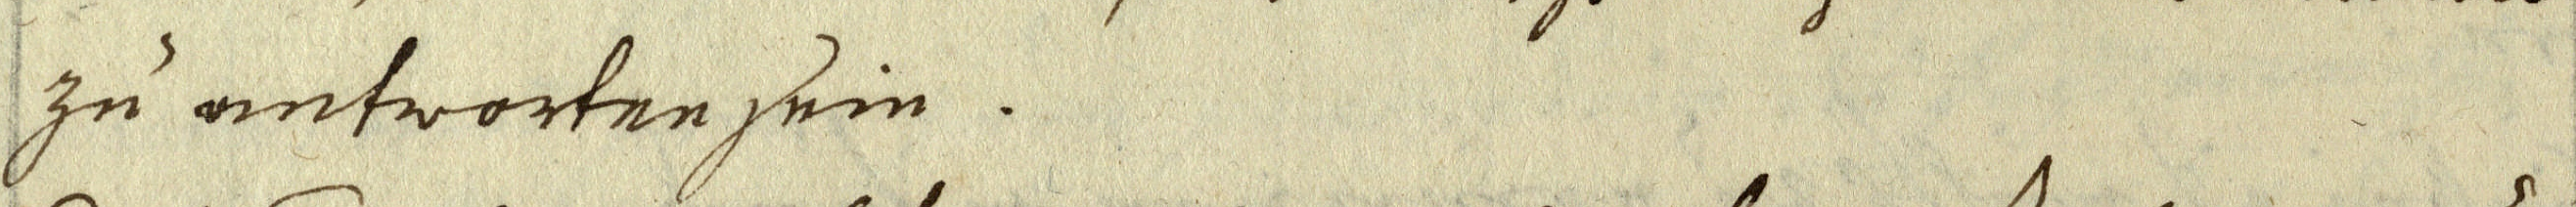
zu antworten sein.
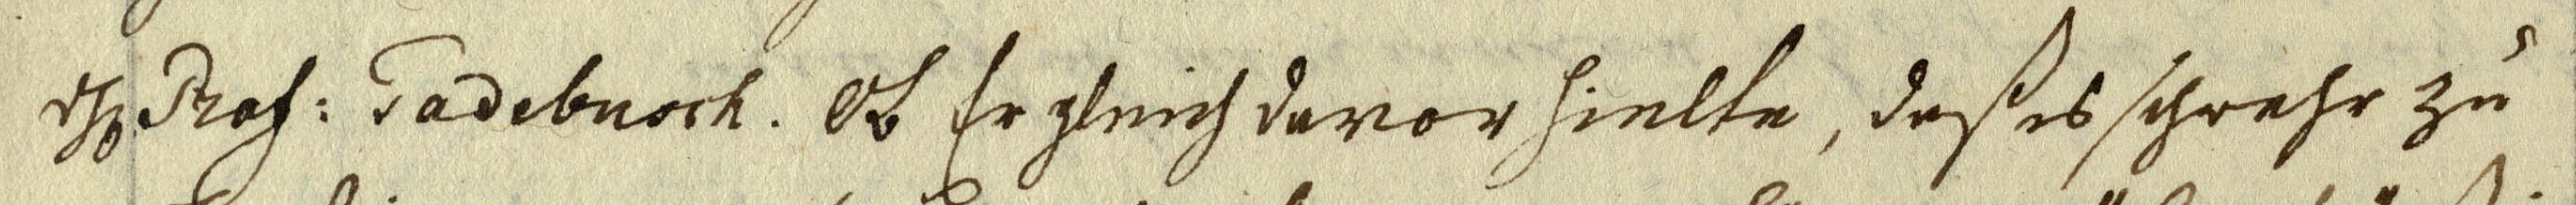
dh Prof: Gadebusch. Ob Er gleich davor hielte, daß es schwehr zu
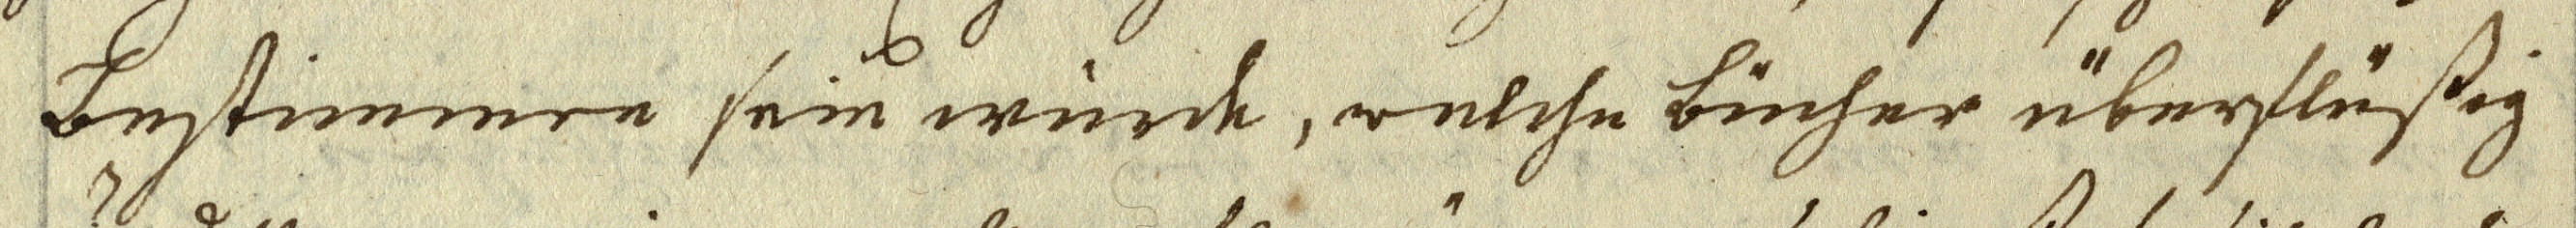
bestimmen sein würde, welche Bücher überflüßig
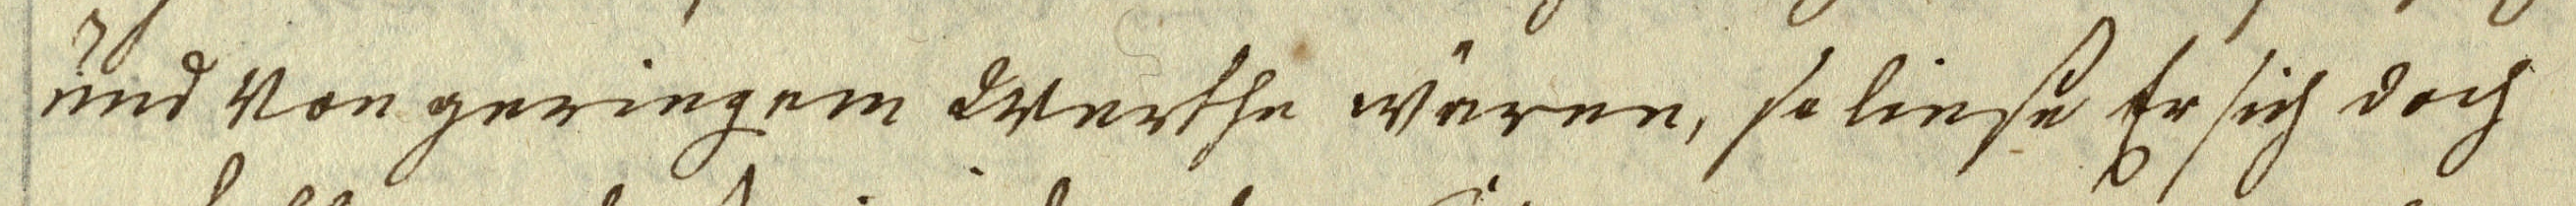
und von geringem Werthe wären, so ließe Er sich doch
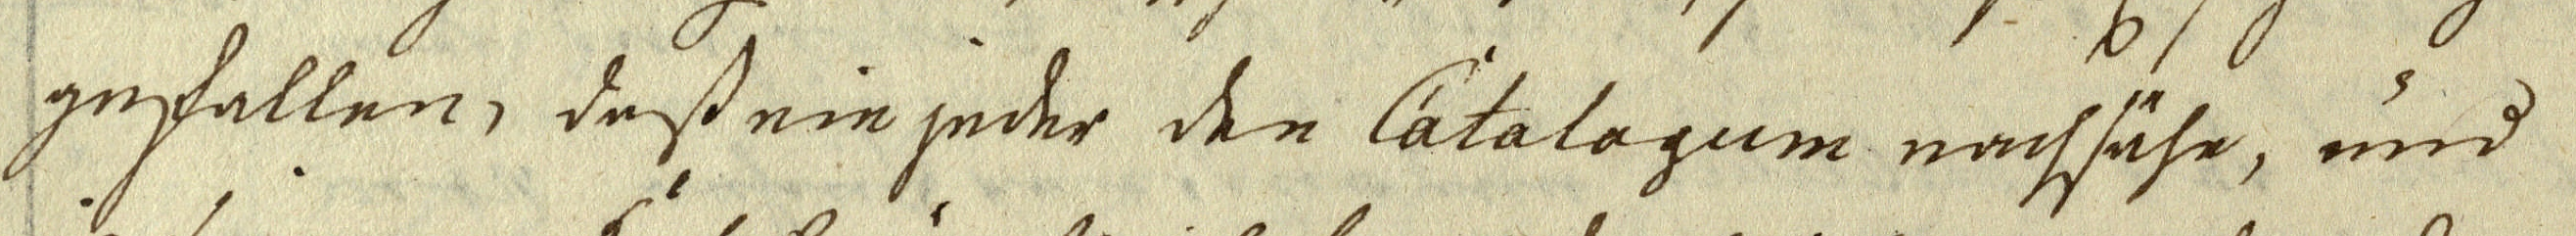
gefallen, daß ein jeder den Catalogum nachsähe, und
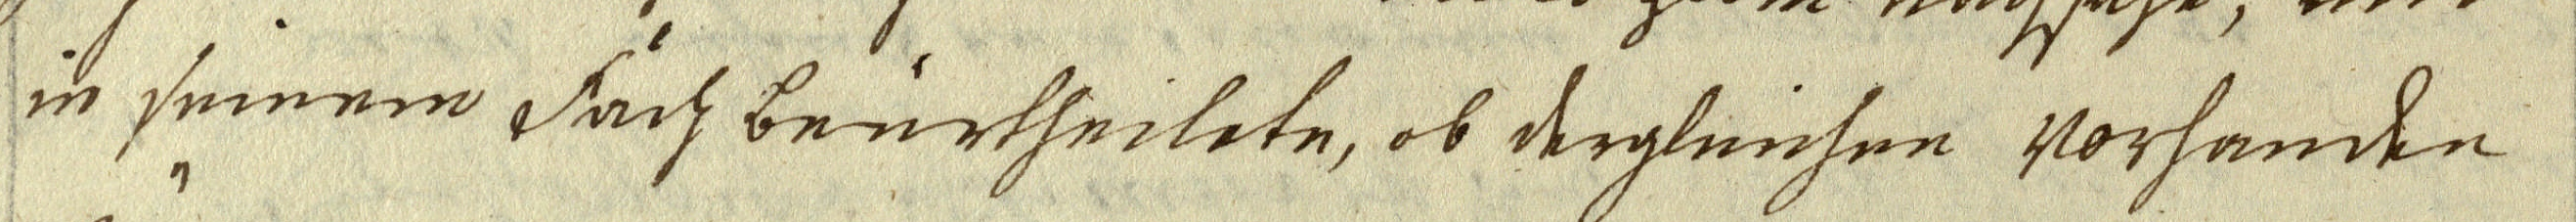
in seinem Fach beurtheilete, ob dergleichen vorhanden
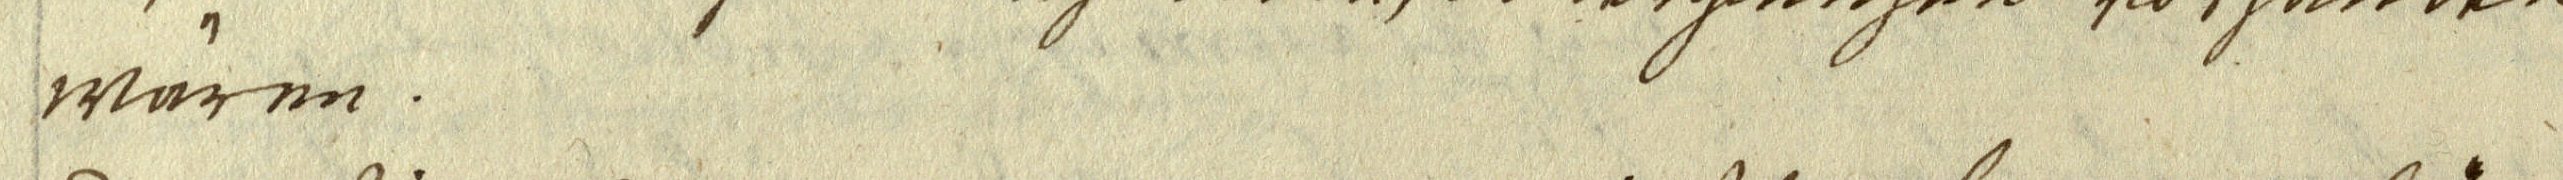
wären.
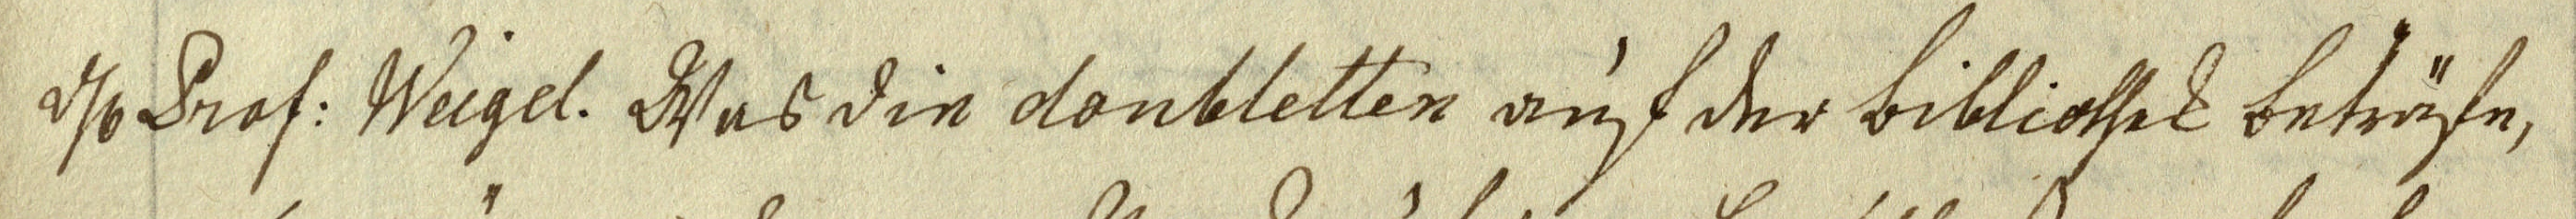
dh Prof: Weigel. Was die doubletten auf der Bibliothek beträfe,
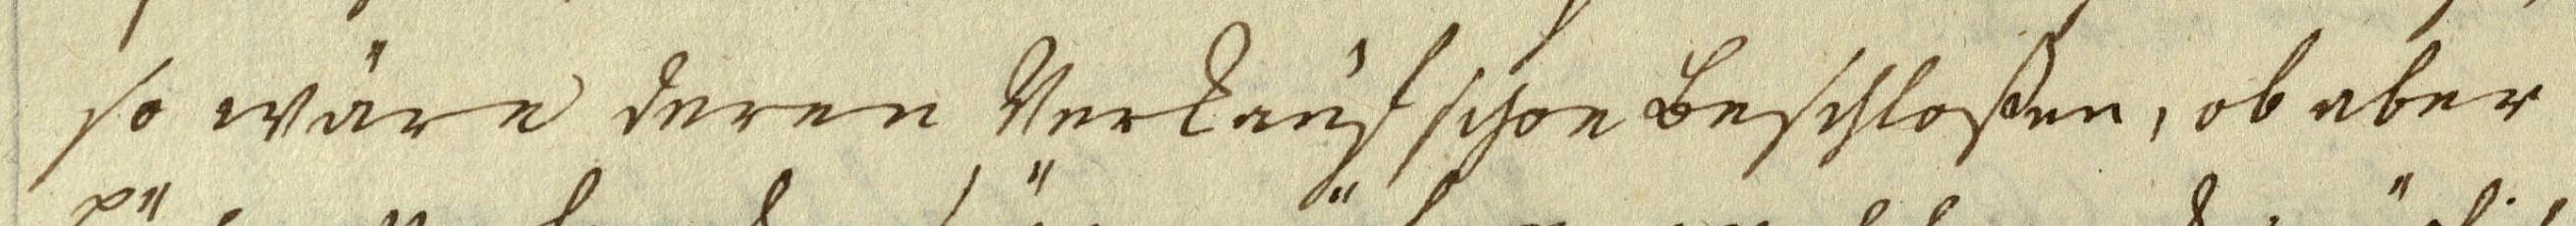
so wäre deren Verkauf schon beschlossen, ob aber
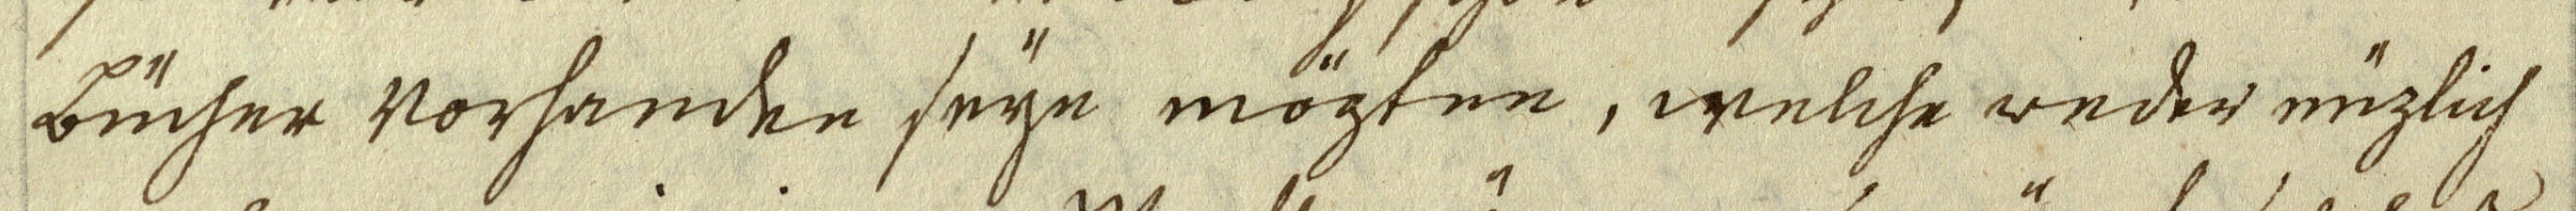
Bücher vorhanden seÿn mögten, welche weder nüzlich
